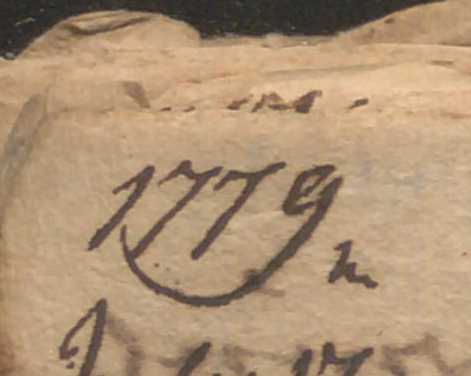1779
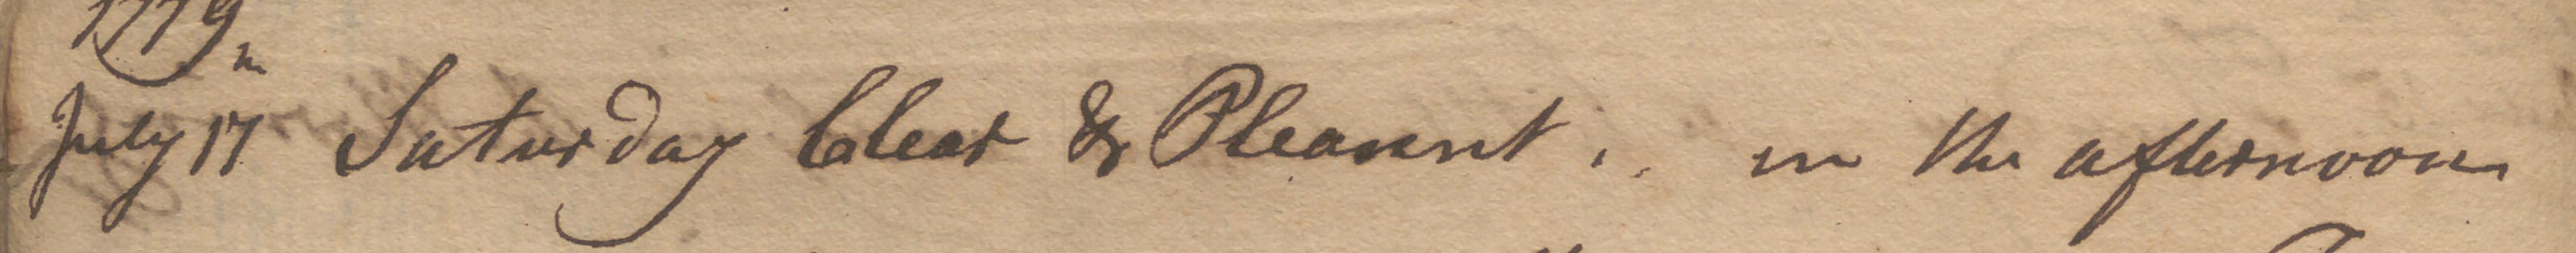July 17 Saturday Clear & Pleasent, in the afternoon
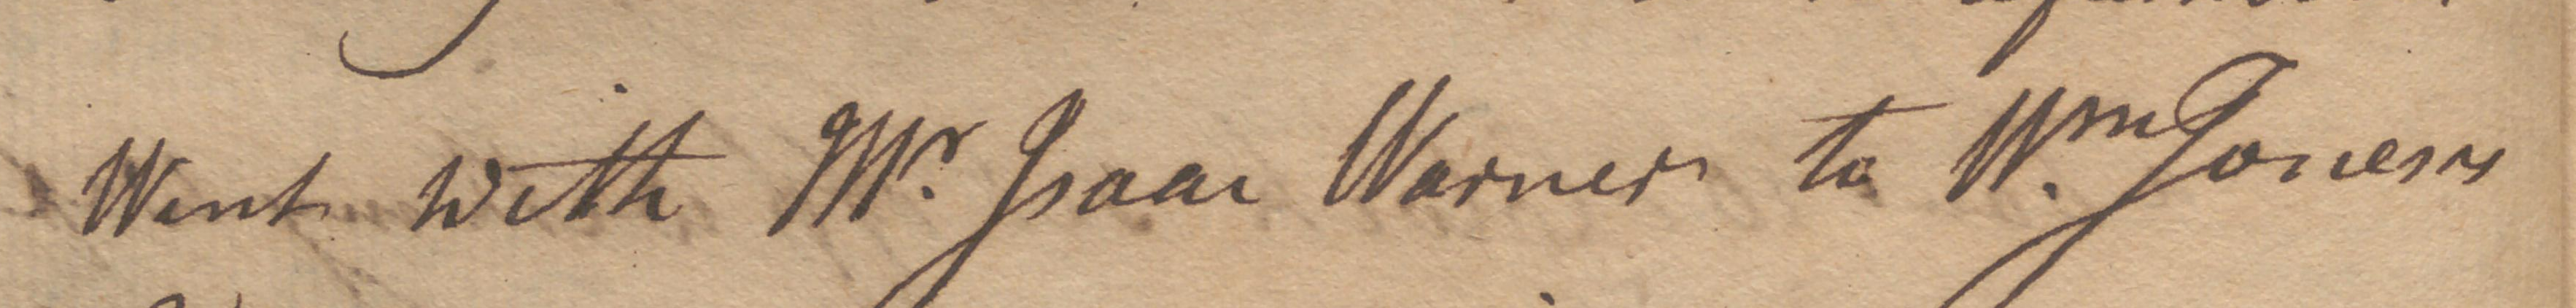Went with M^r. Isaac Warner to W^m. Joneses
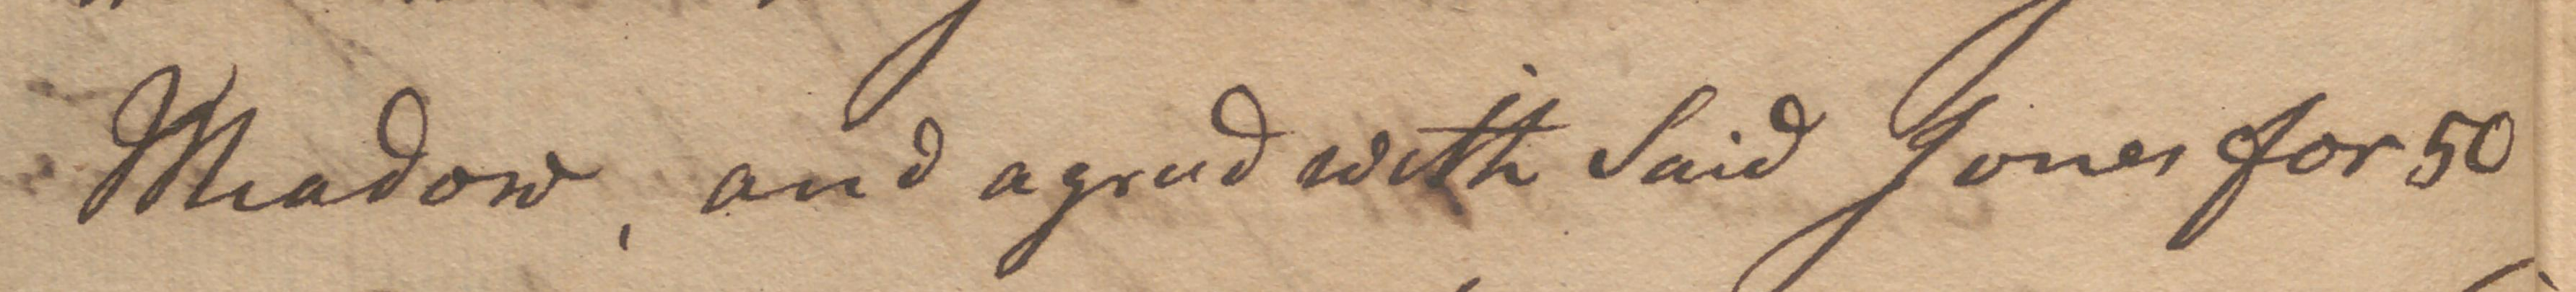Meadow, and agred with said Jones for 50
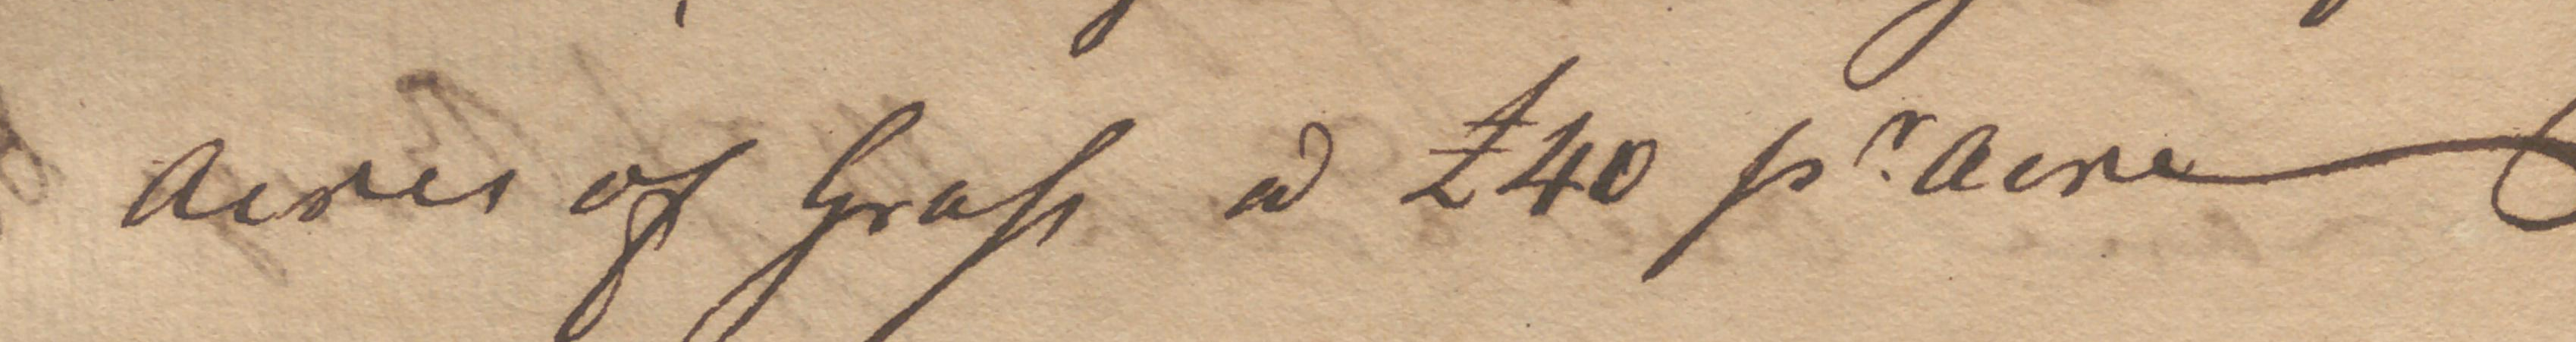dires of Grass @ £40 p^r. acre
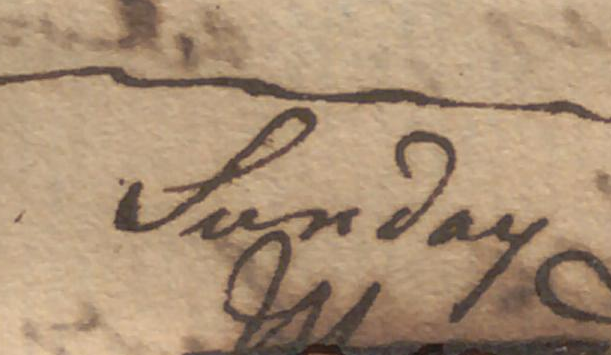Sunday
